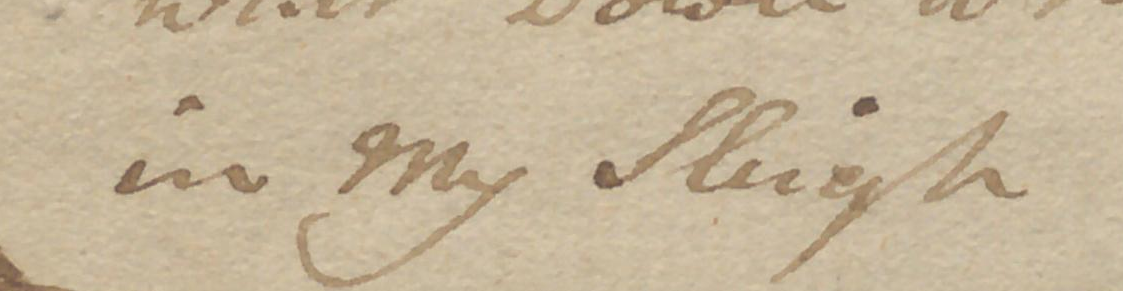in my Sleigh
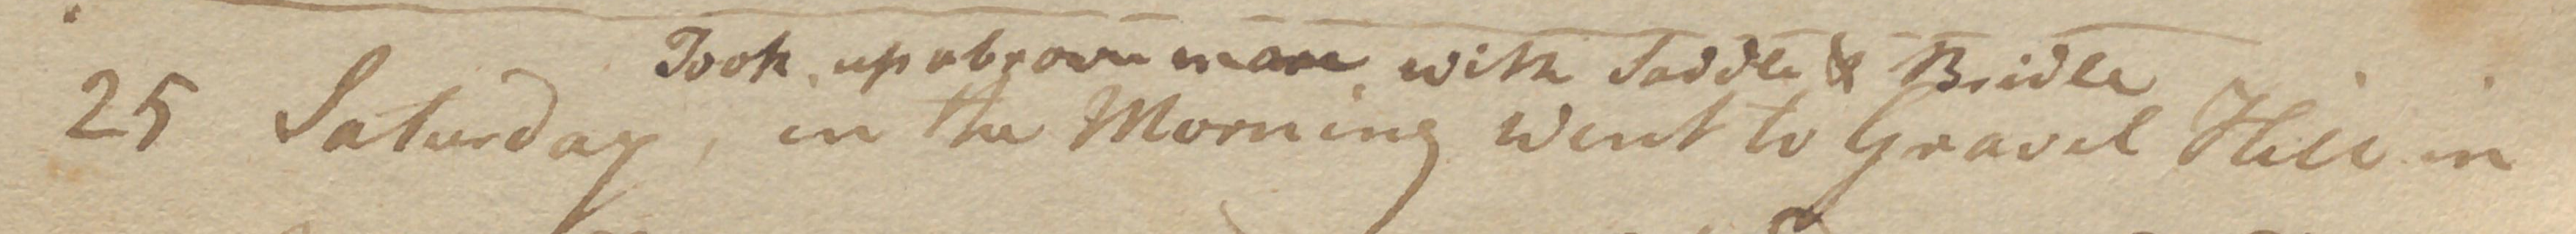25 Saturday, in the Morning went to Gravel Hill in
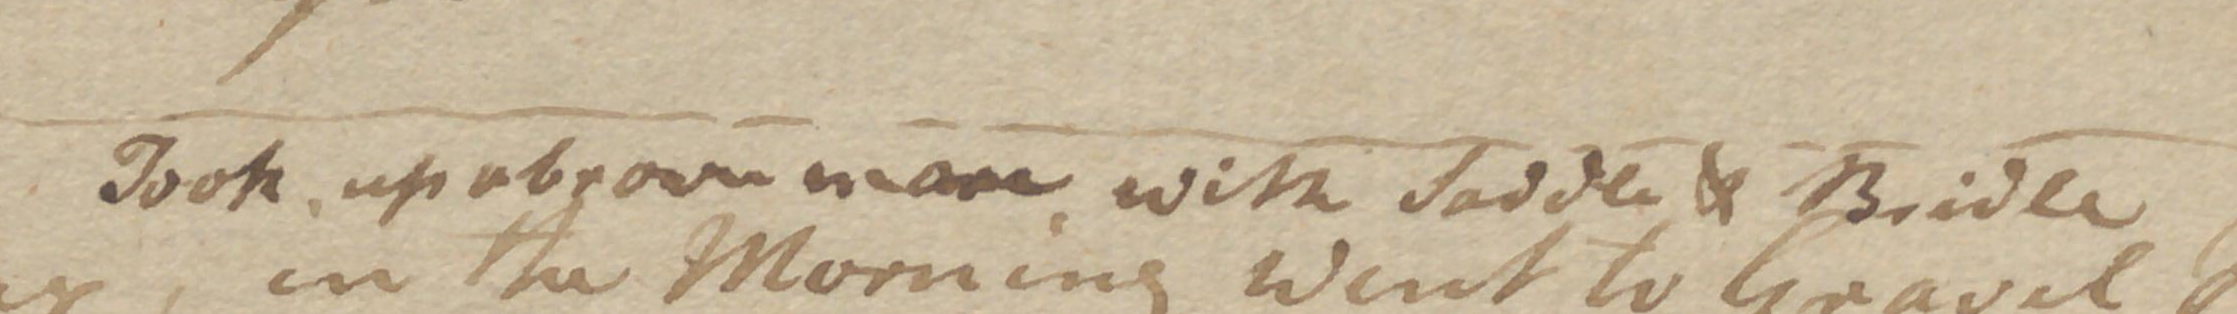Took up a brown mare with Saddle & Bridle
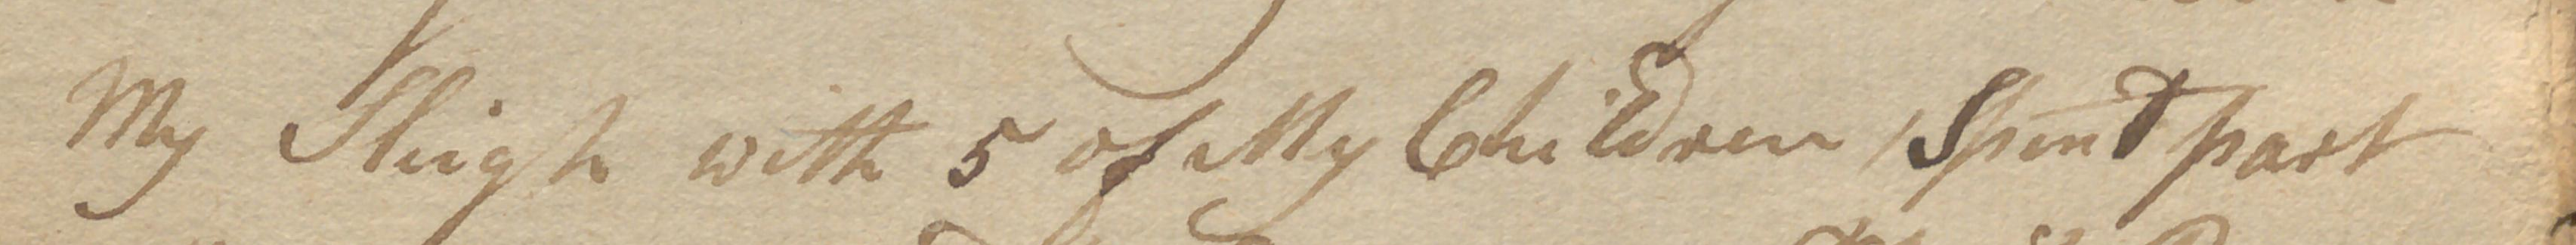My Sleigh with 5 of My Children spent part
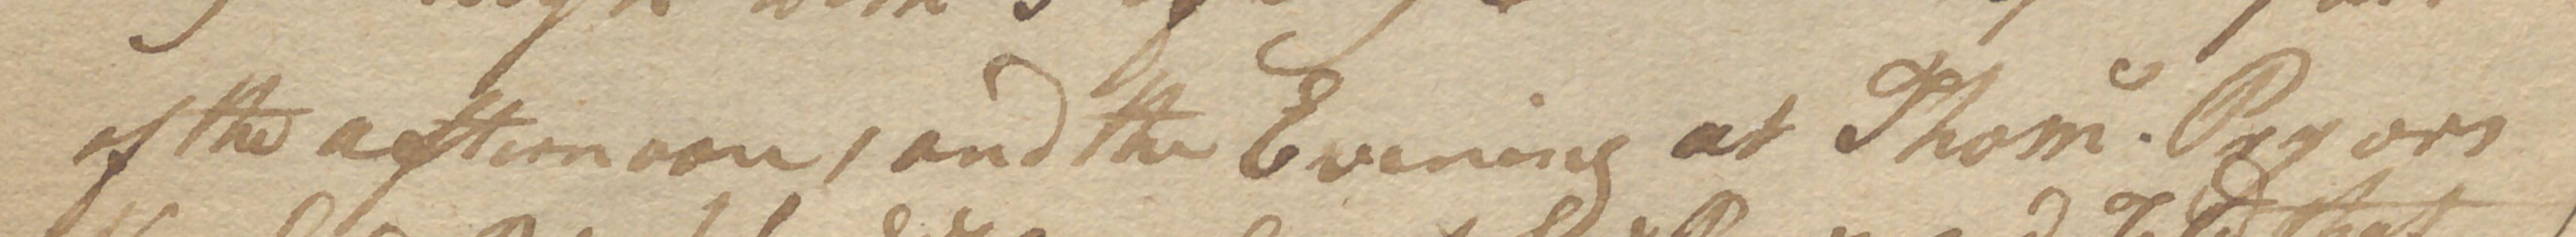of the afternoon, and the Evening at Thom^s. Pryors
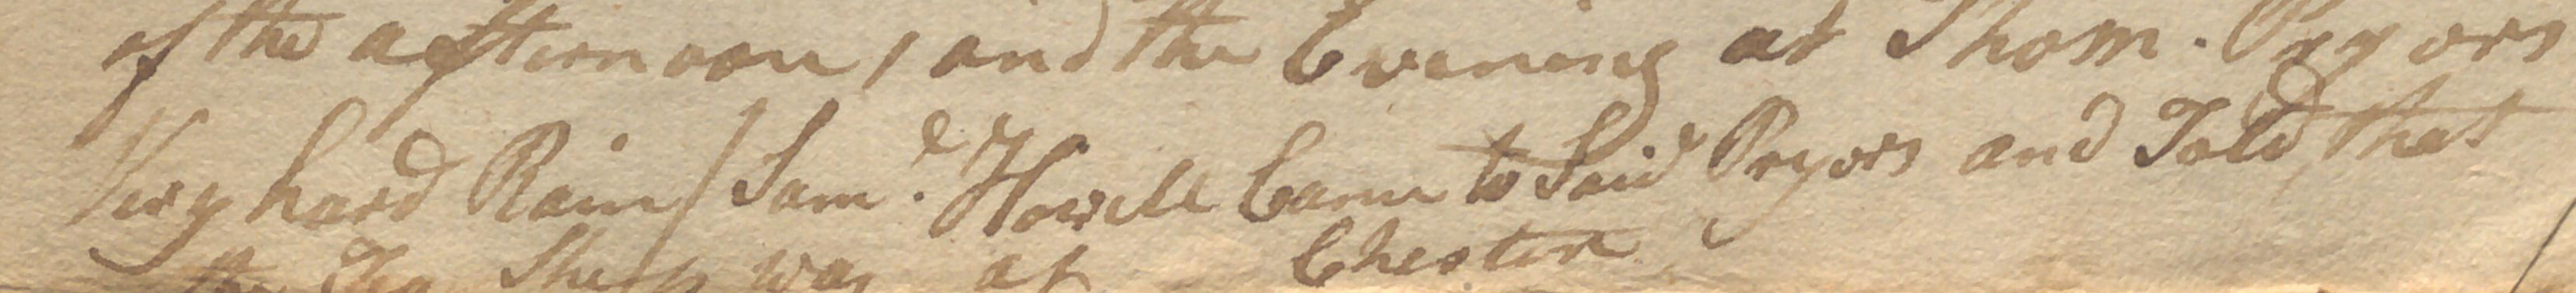Very hard Rain / Sam^l. Howell Came to Said Pryors and Told that
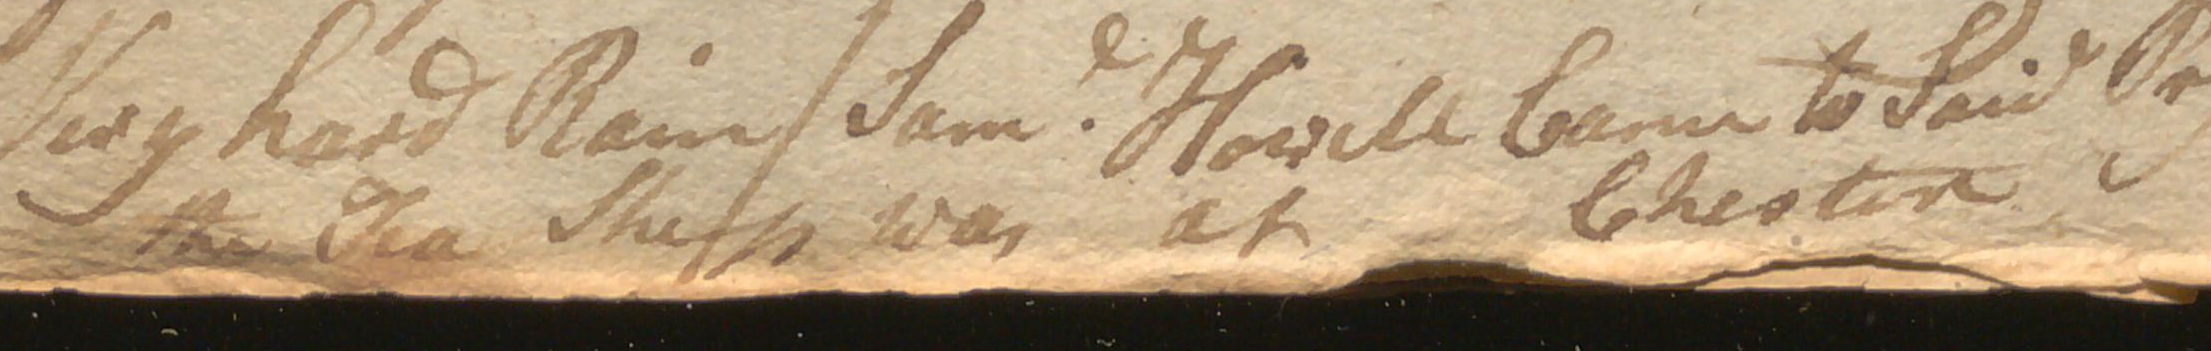the Tea Ship was at Chester
